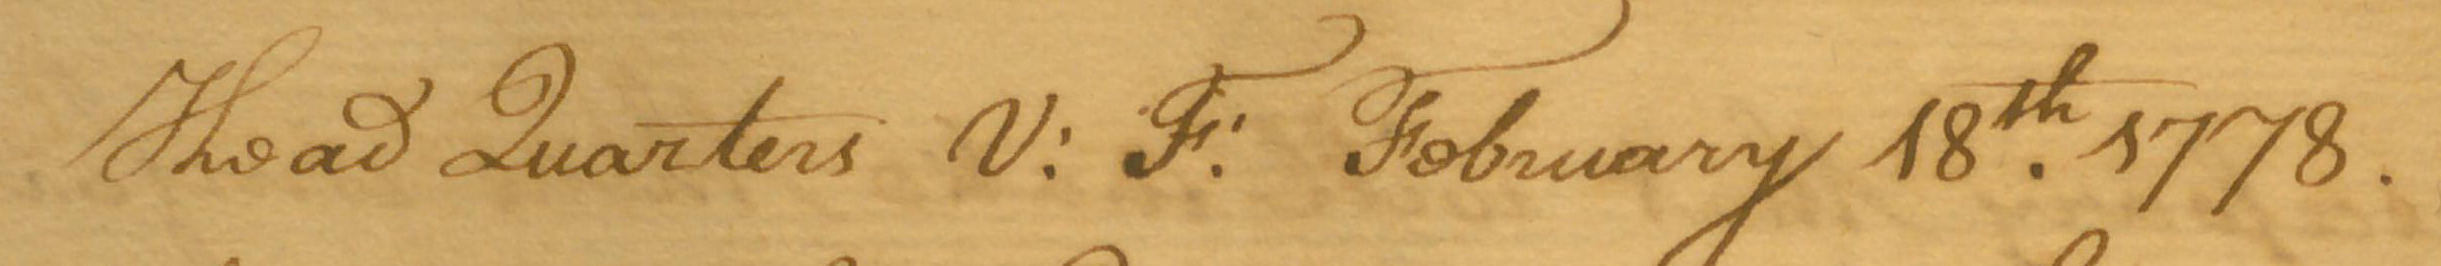Head Quarters V: F: February 18^th. 1778.
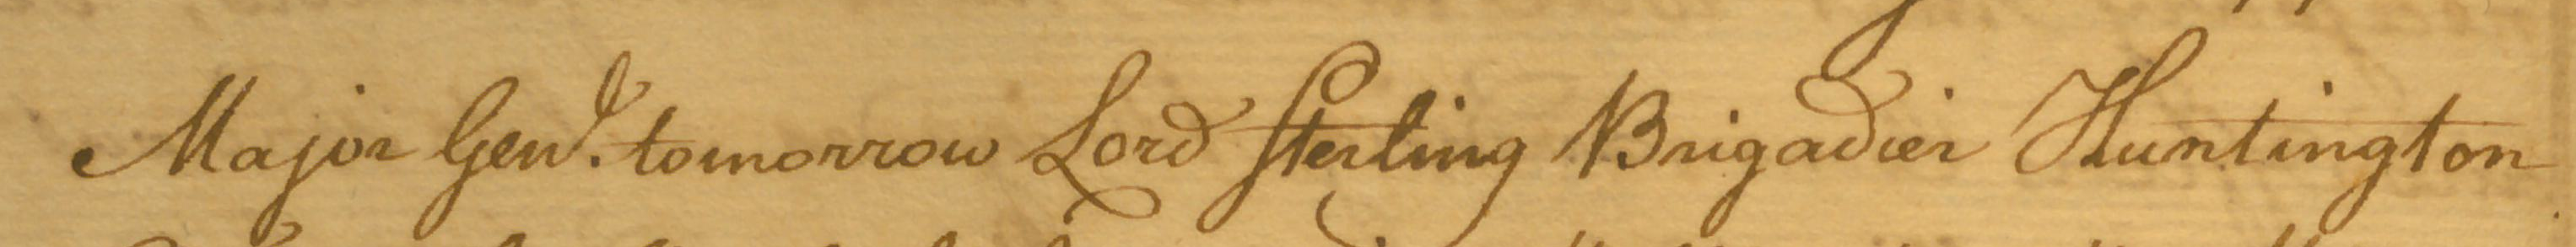Major Gen^l. tomorrow Lord Sterling Brigadier Huntington
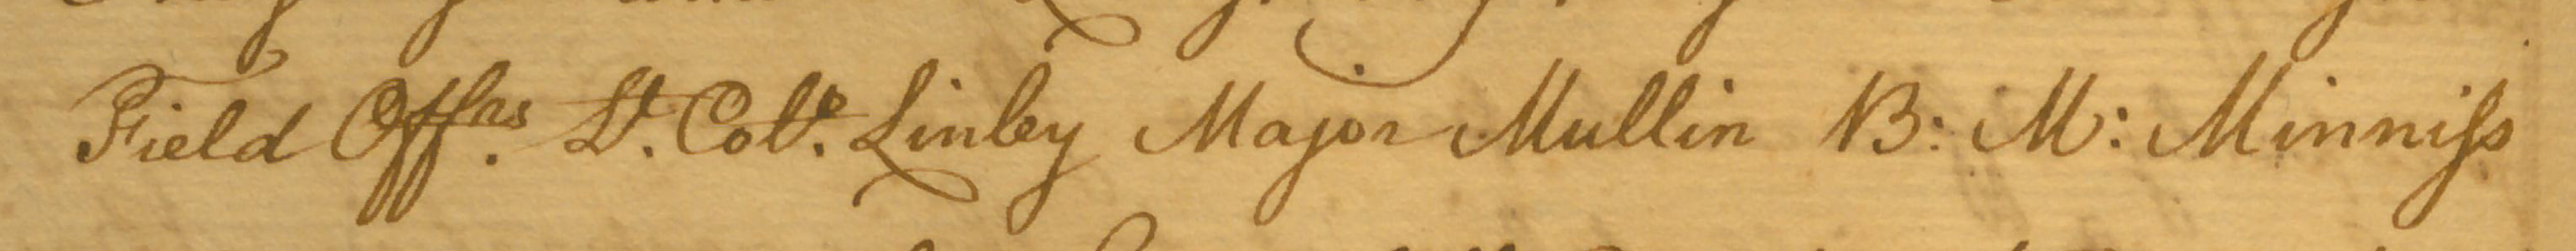Field Off^rs. L^t. Col^o. Linley Major Mullin B: M: Minniss
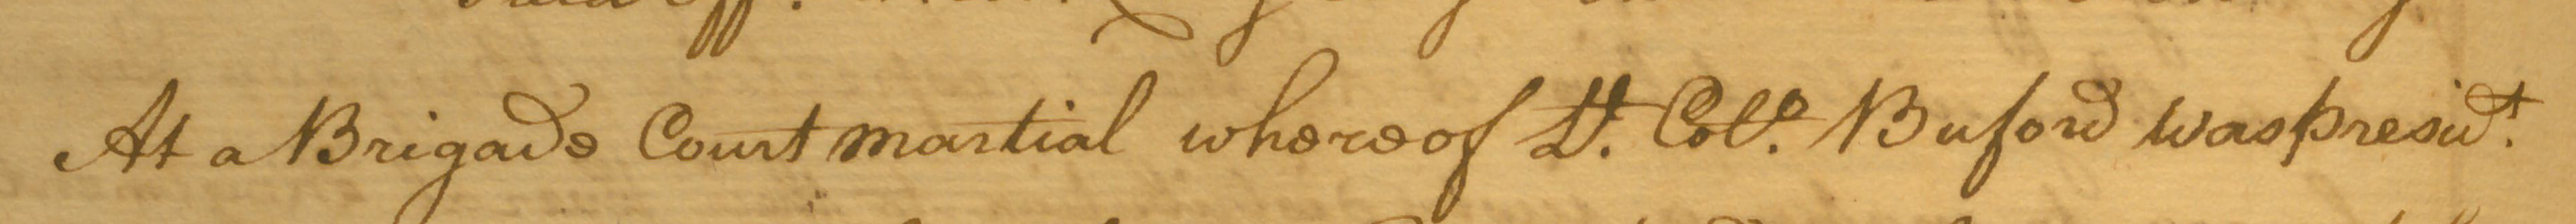At a Brigade Court martial whereof L^t. Col^o. Buford was presid^t.
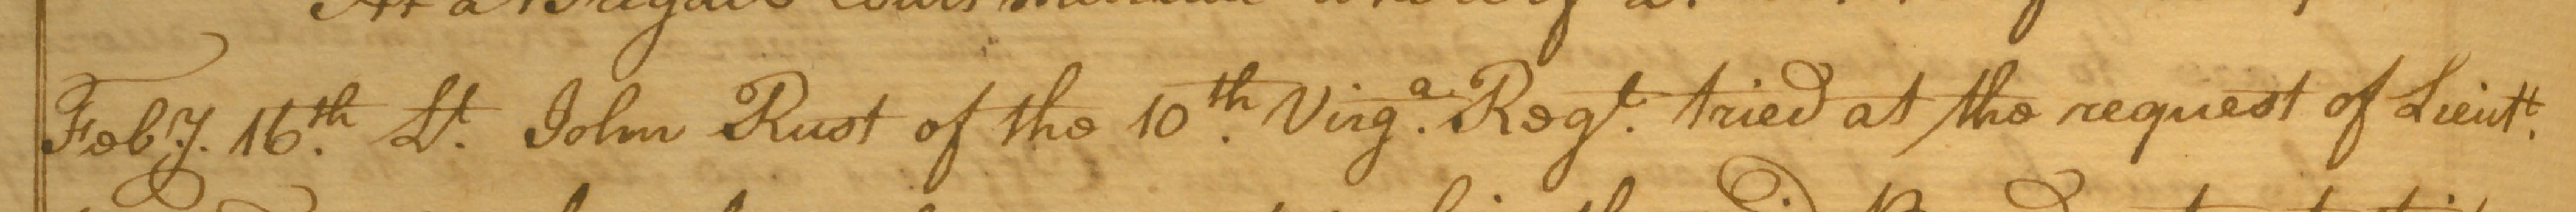Feb^y. 16^th. L^t. John Rust of the 10^th. Virg^a. Reg^t. tried at the request of Lieut^t.
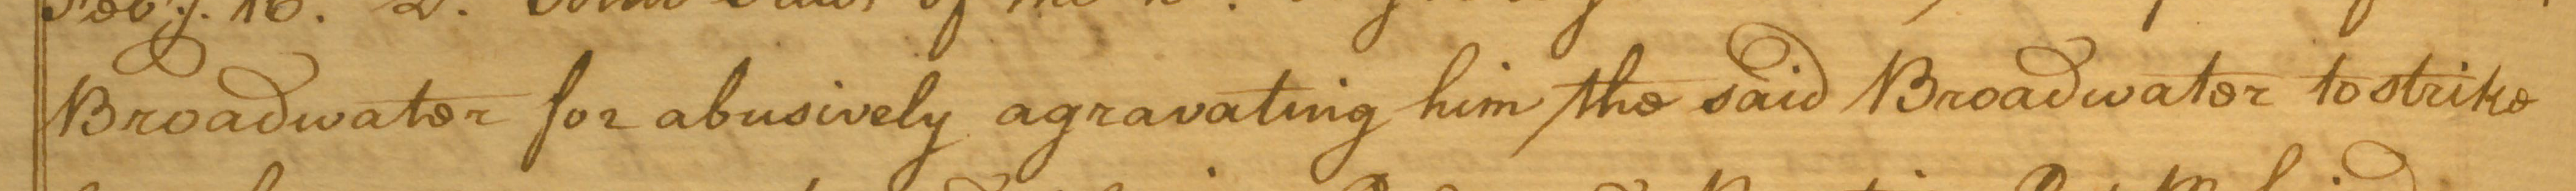Broadwater for abusively agravating him the said Broadwater to strike
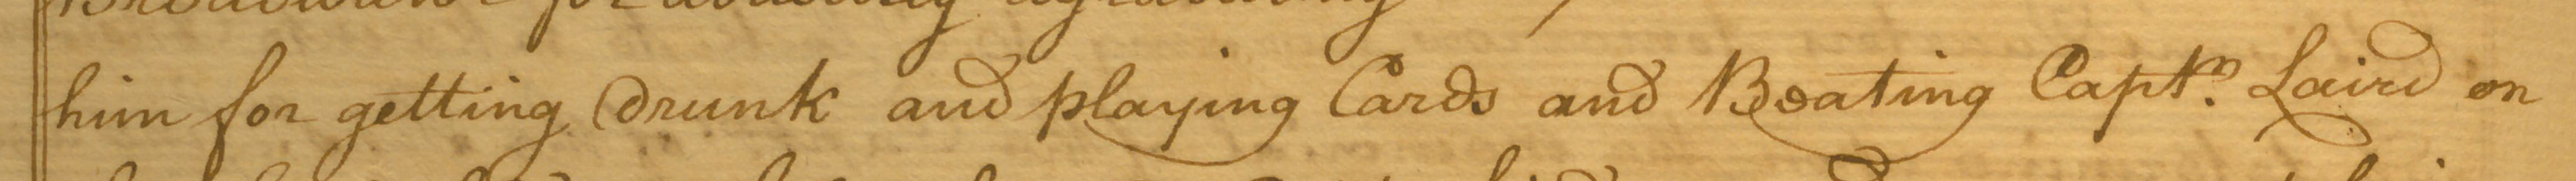him for getting drunk and playing Cards and Beating Capt^n. Laird on
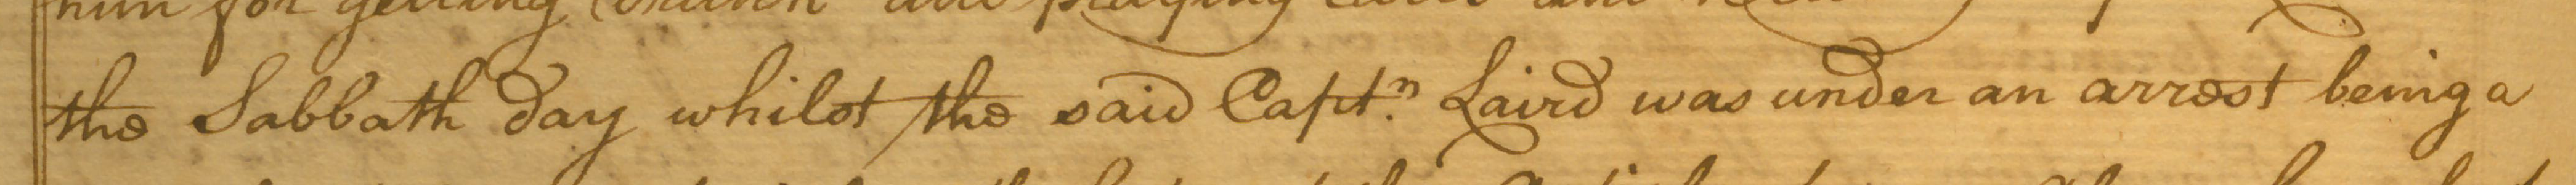the Sabbath day whilst the said Capt^n. Laird was under an arrest being a
